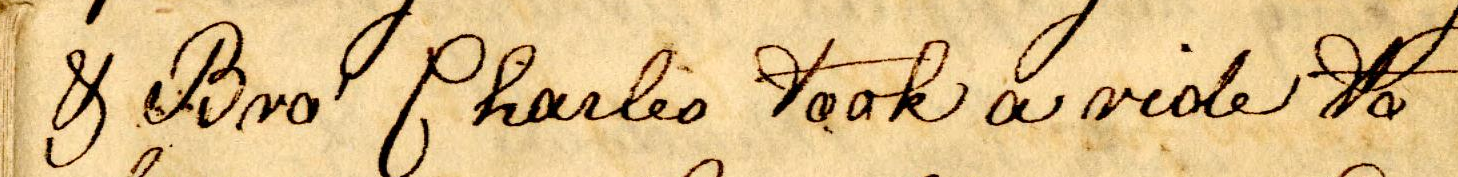& Bro' Charles took a ride to
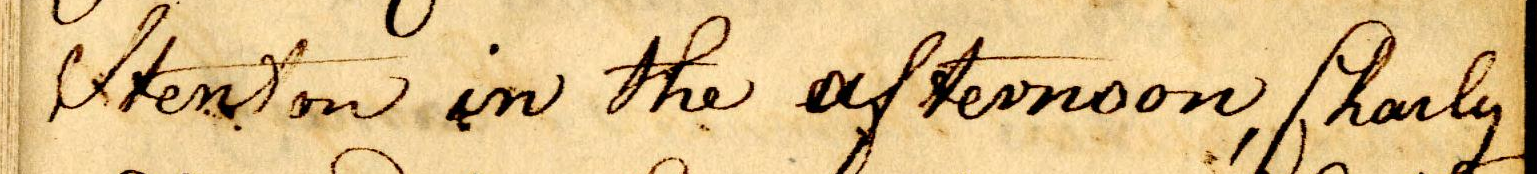Stenton in the afternoon, Charly
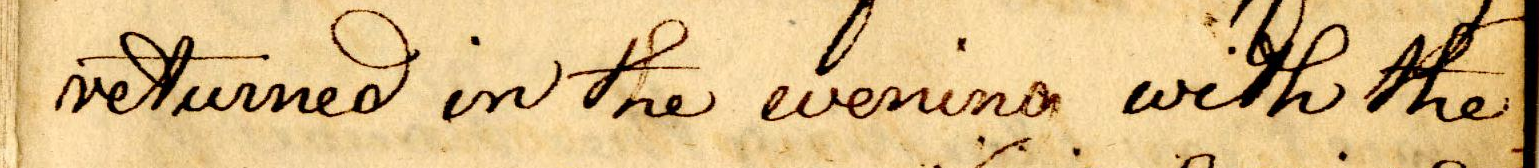returned in the evening with the
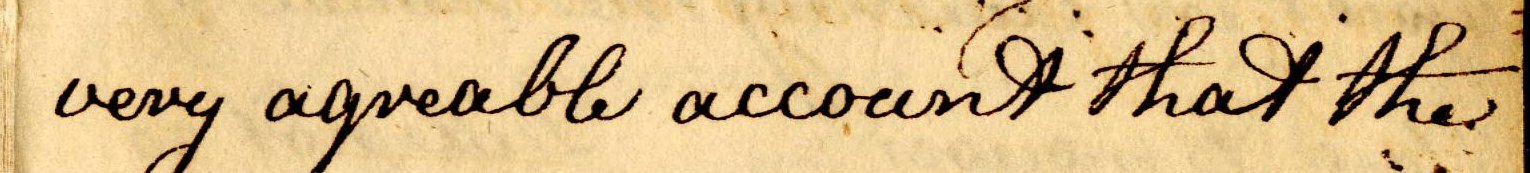very agreable account that the
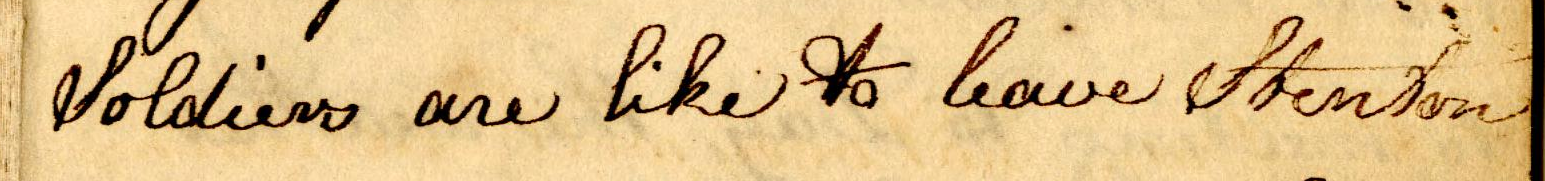Soldiers are like to leave Stenton
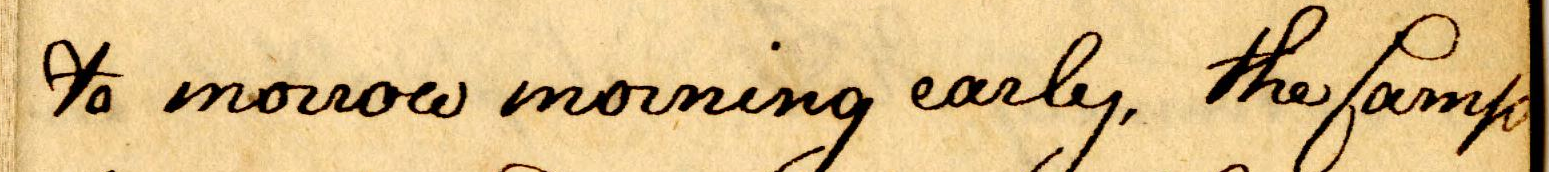to morrow morning early, the Camp
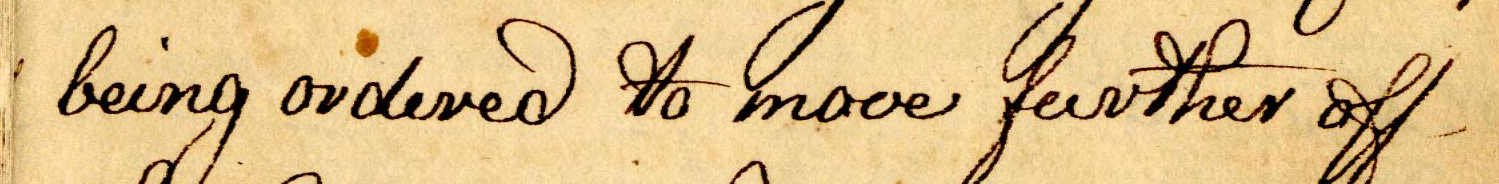being ordered to move further off
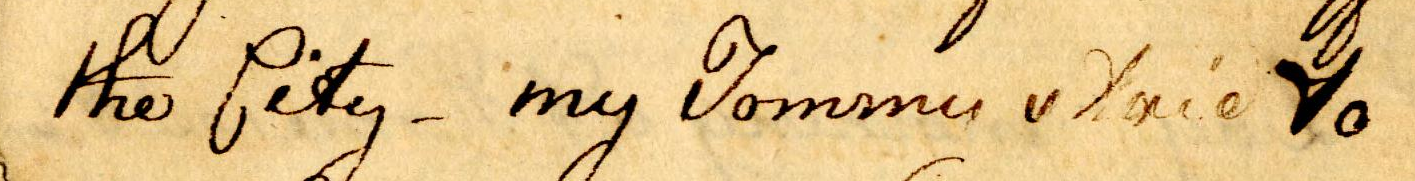the City- my Tommy staid to
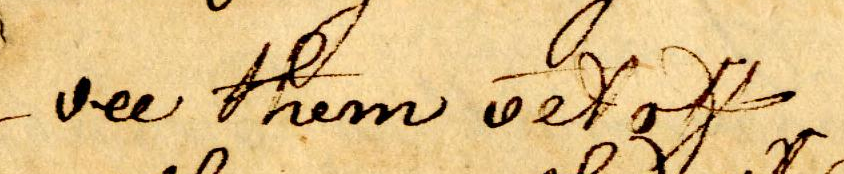see them set off
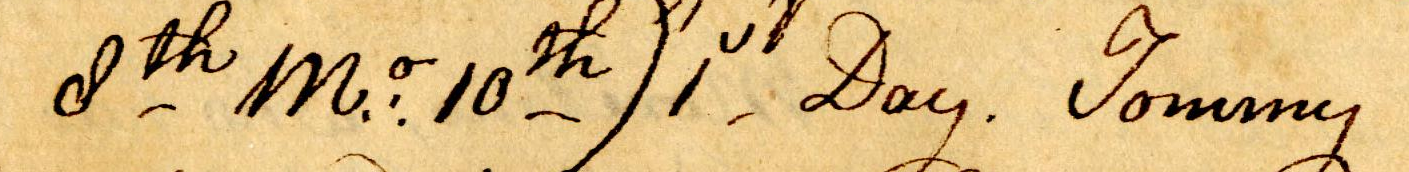8^th M^o 10^th ) 1^st Day. Tommy
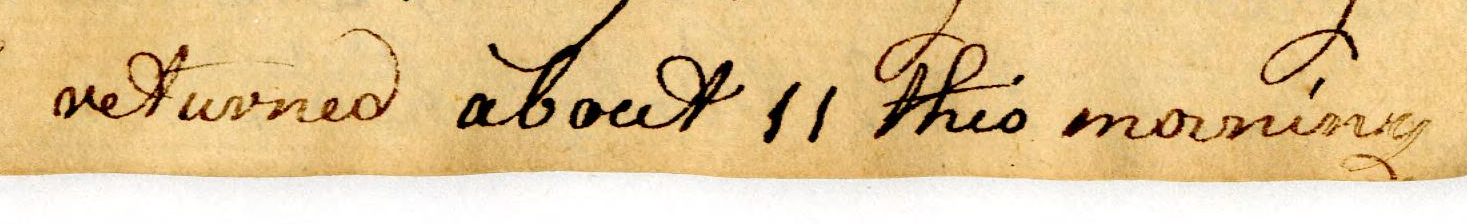returned about 11 this morning
